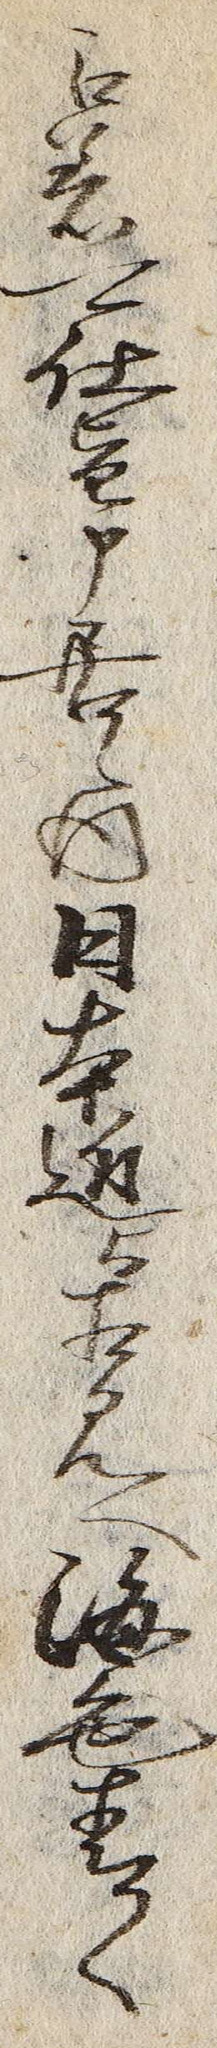へ着可仕旨申居候内日本近と相見へ海色青く
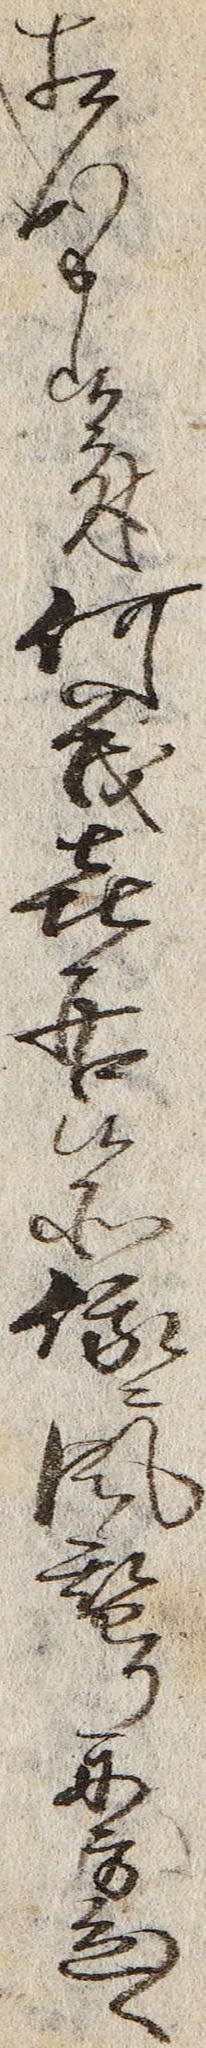相成申候に付何も喜居候所俄に風替り舟方色々
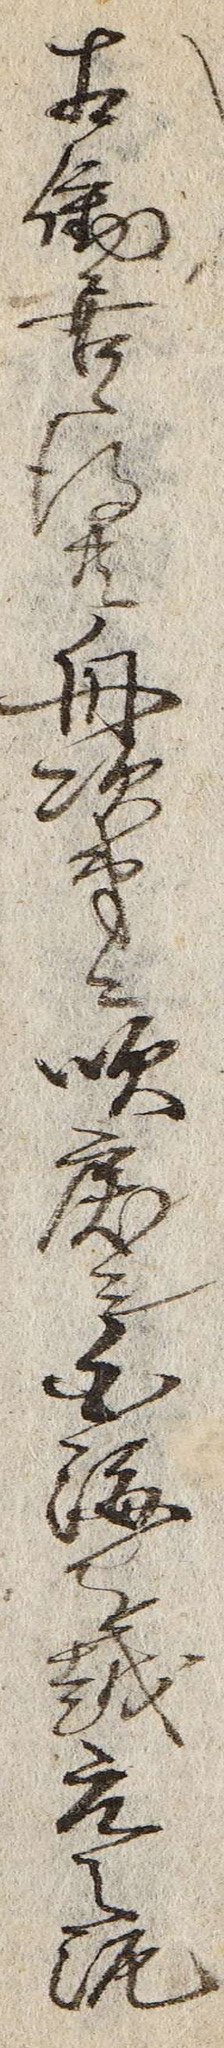相働居候得ども舟次第に吹戻し白海を越えて泥
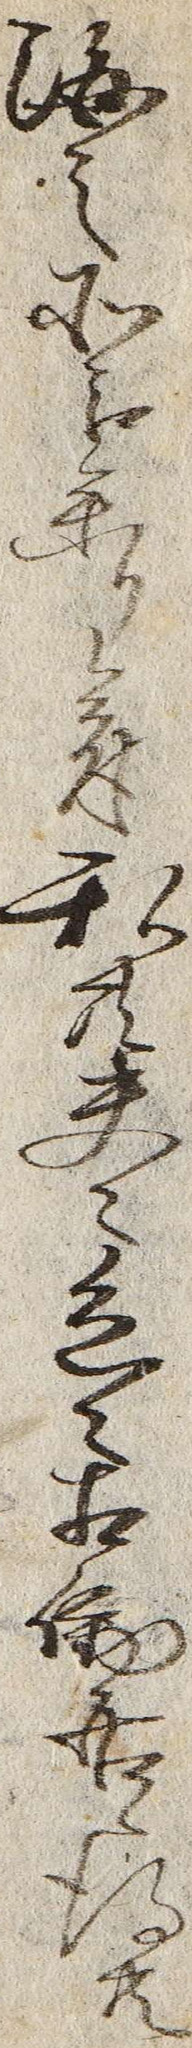海の所へ参り候に付私ども夫々色々相働居候得ども
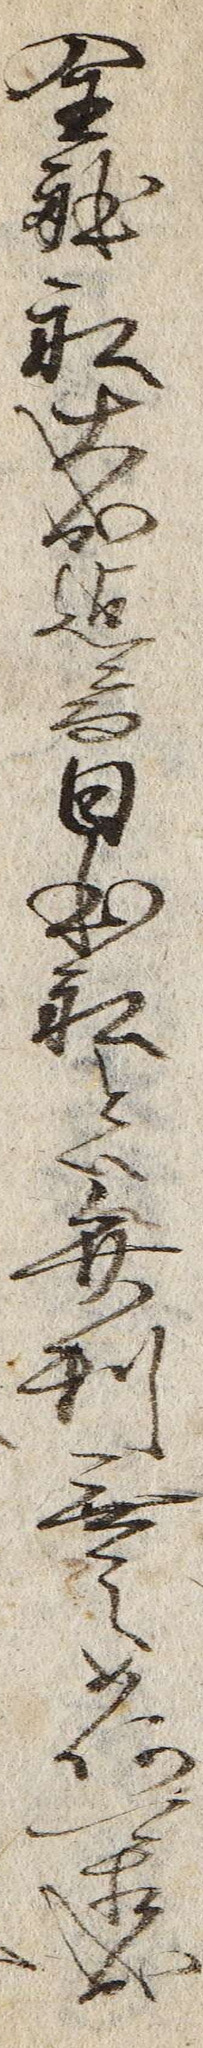全体船大成までにて日本船とは弁利無之如何に可相成
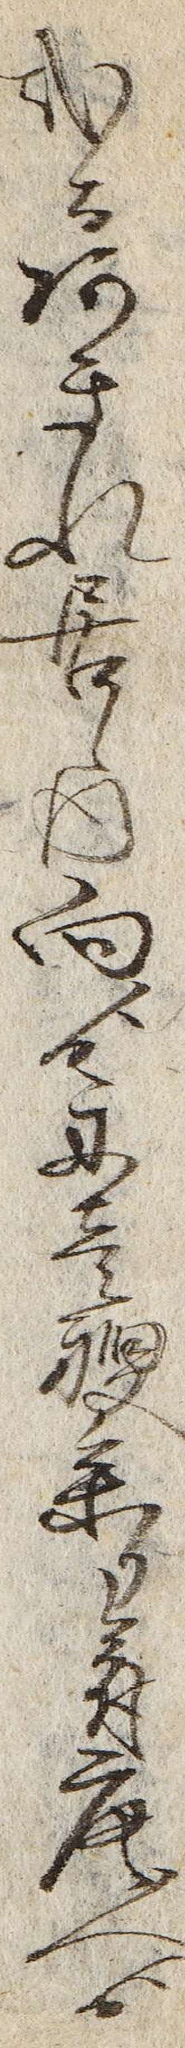やとあきれ居候内向より舟一艘参り候に付唐人より
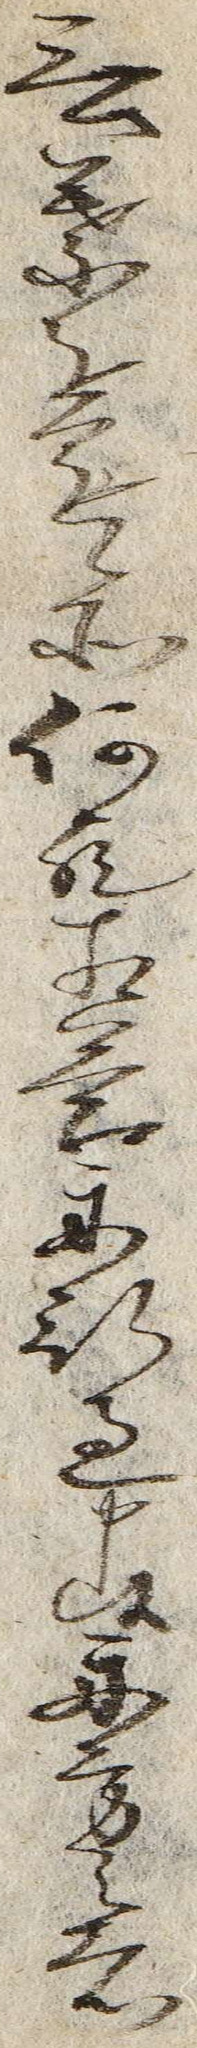言葉を懸候所何か相答舟行過申候舟方の者
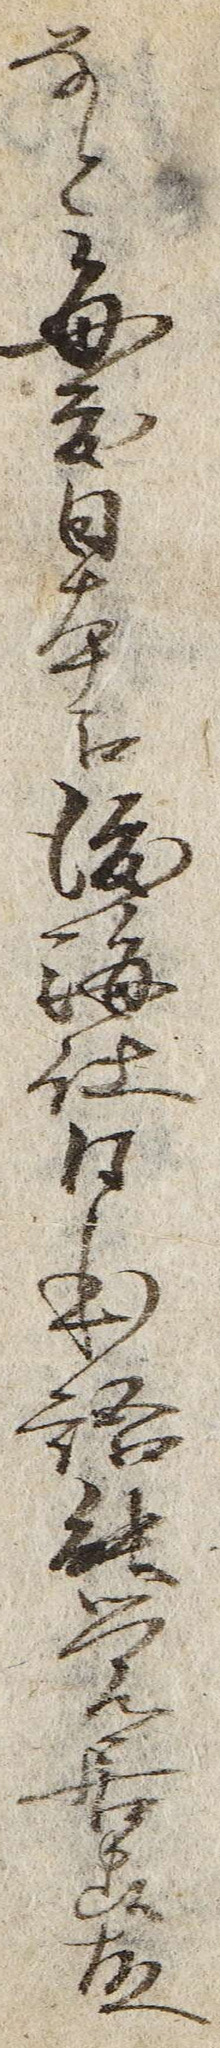なと毎度日本へ渡海仕日本語能覚居申候故
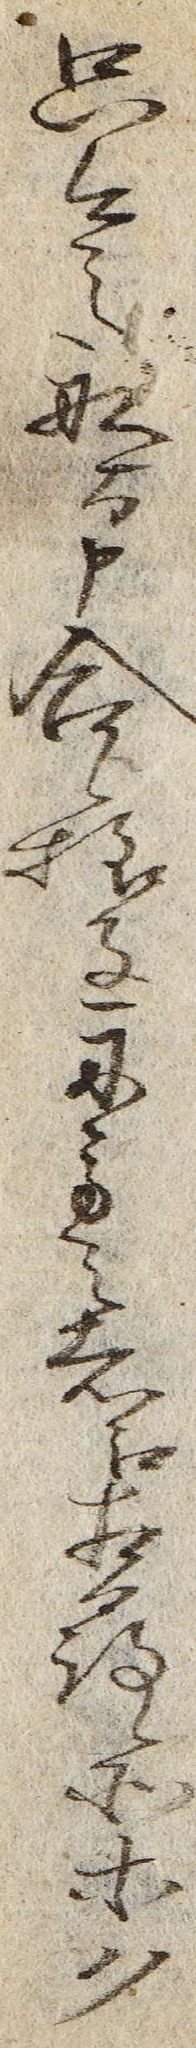只今の船方申合の様子舟方の者へ相尋候所ホク

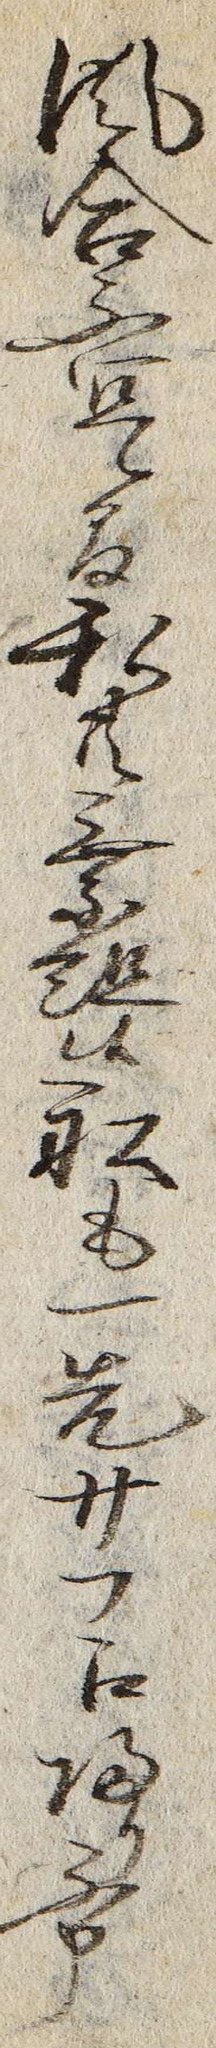風合不宣候間私ども乗組候船も一先サフへ帰り不申
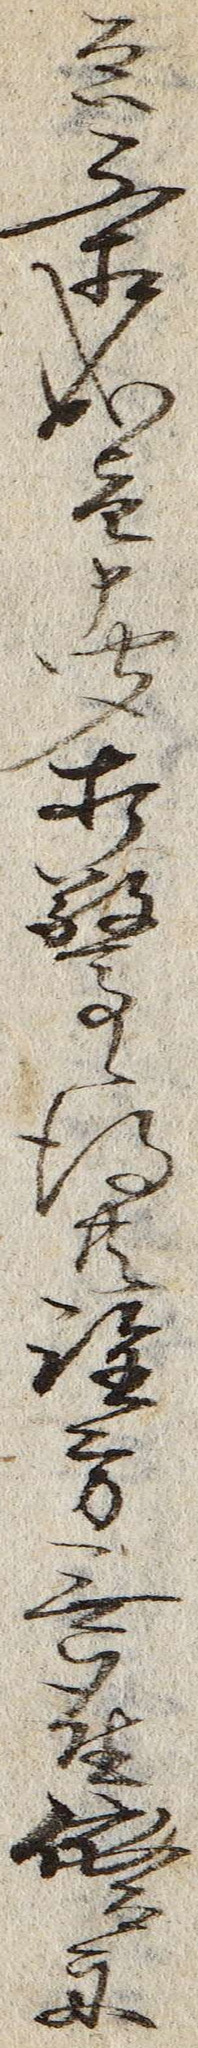ては不相成旨申聞打驚候得ども詮方無御座依て舟
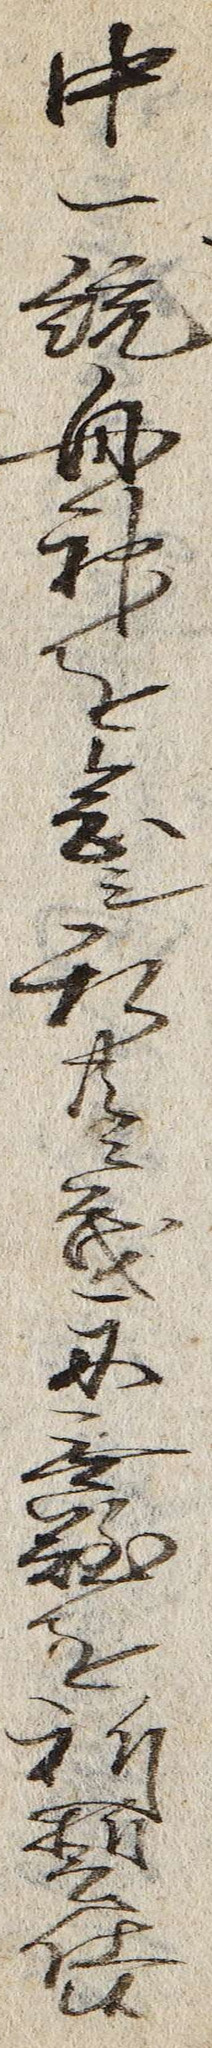中一統舟神を念し私どもにも舟無難を祈誓仕候
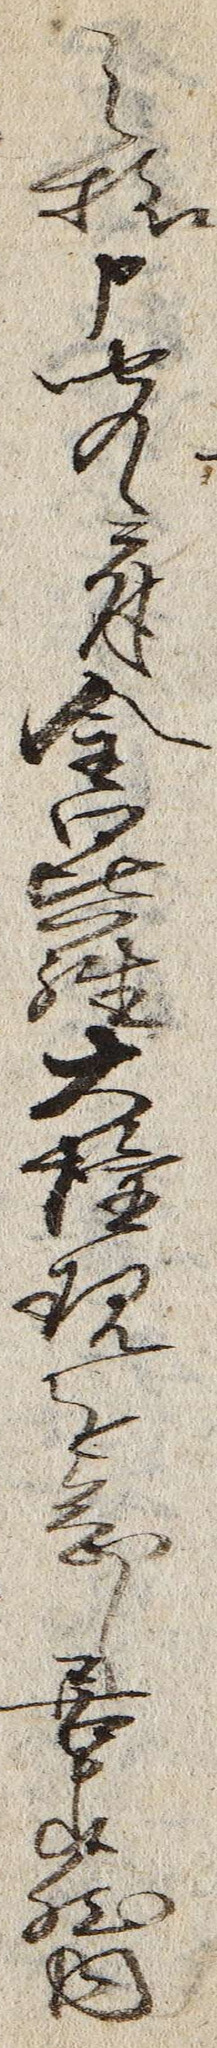の様申聞候に付金毘羅大権現を念し居申候然内
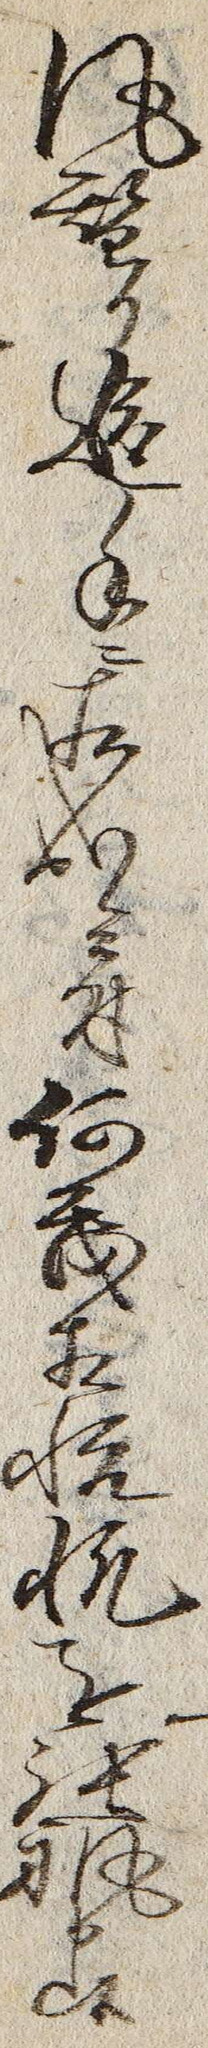風替り追手に相成候に付何も相悦帆を張䑺申候
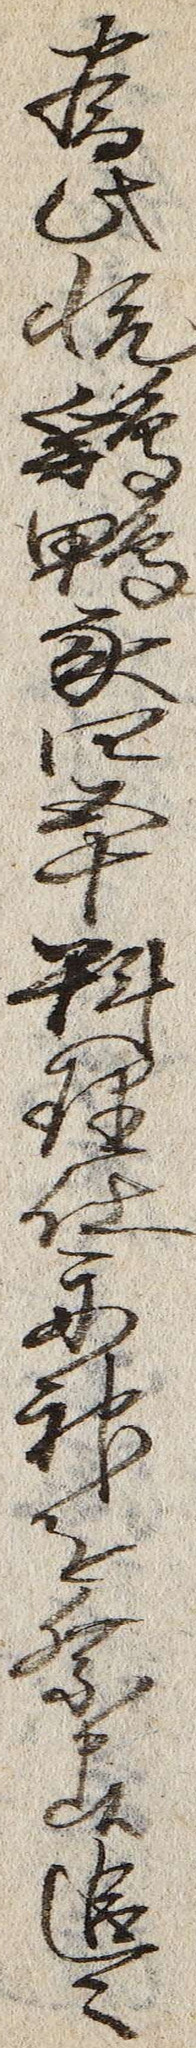為此悦鶏鴨豕四五十料理仕舟神を祭申候追々
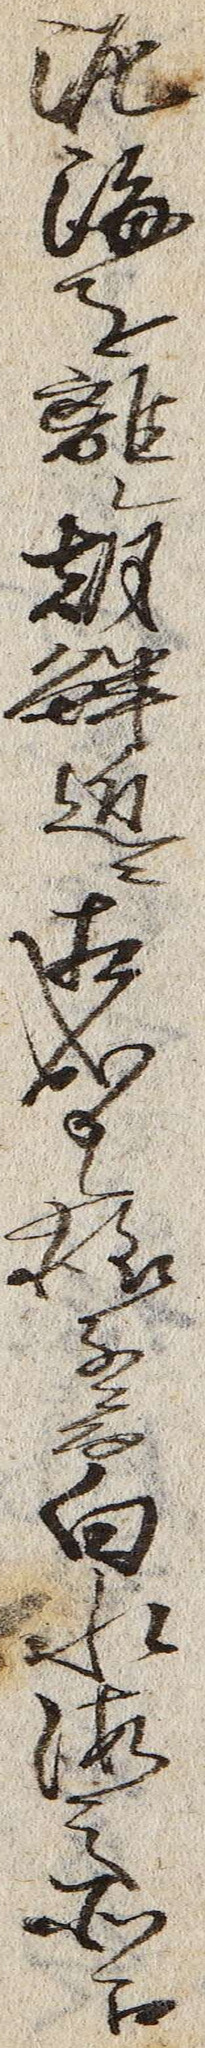泥海を離れ朝鮮近に相成申候様子にて白水海の所へ
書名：能登国清兵衛異国江漂流之始末
